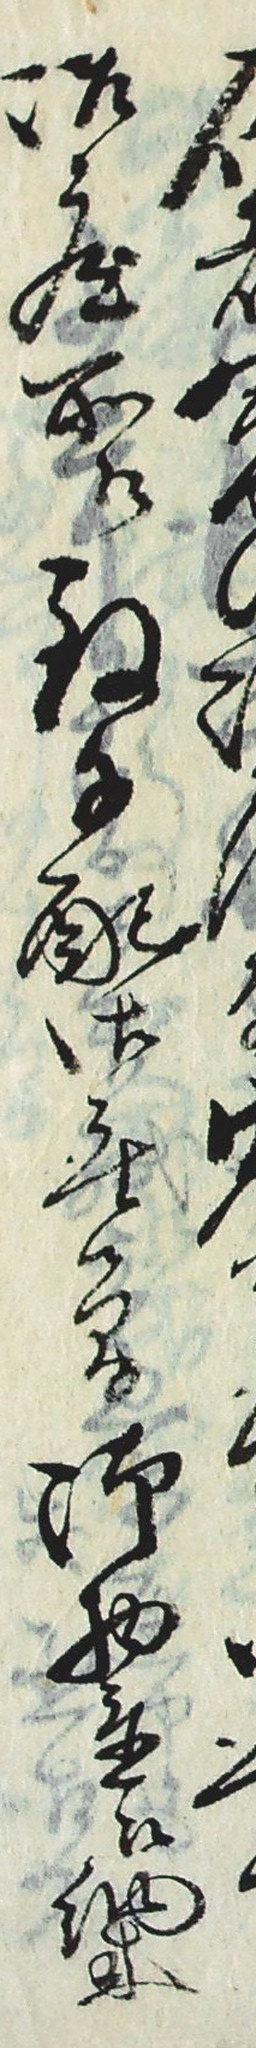御蔵所え致手配御座候間御物置え納来

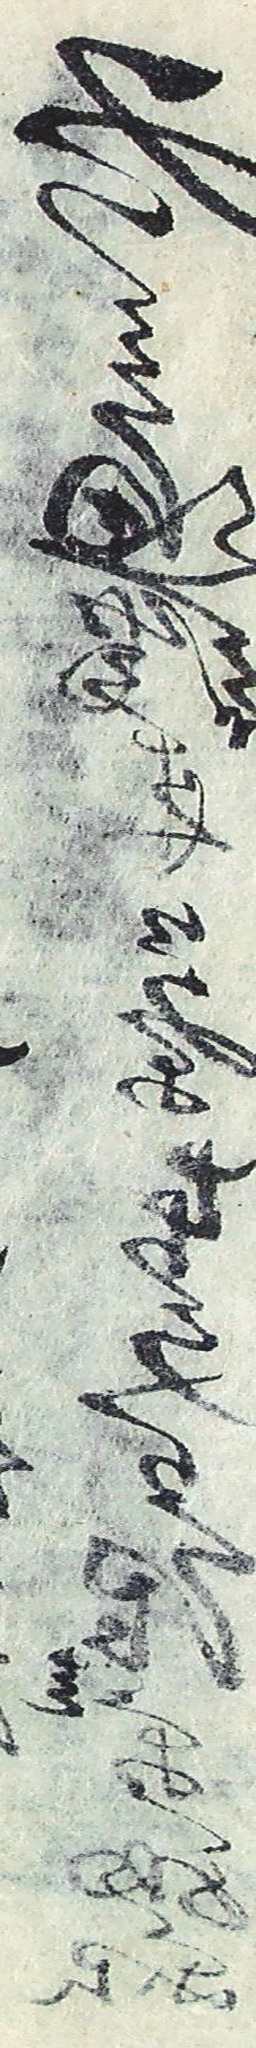子四月廿一日
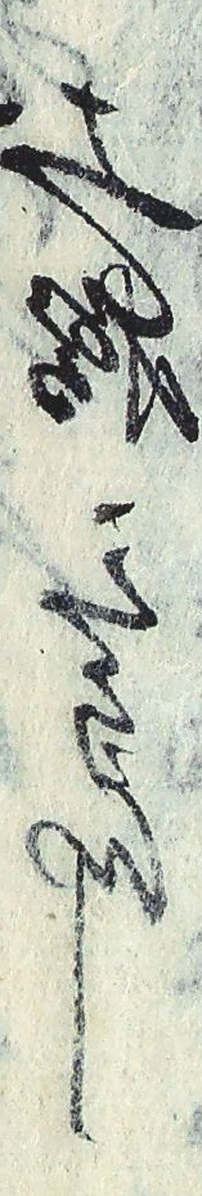子四月廿一日
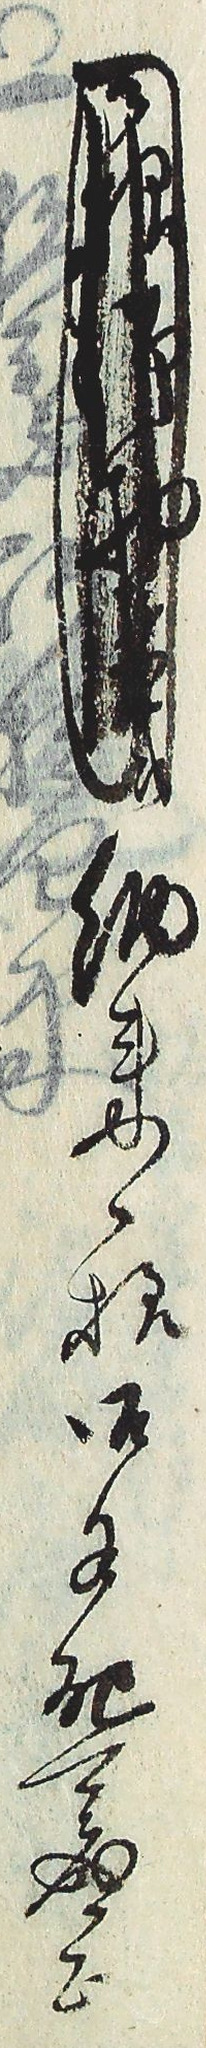納来候様御手配可被成候以上
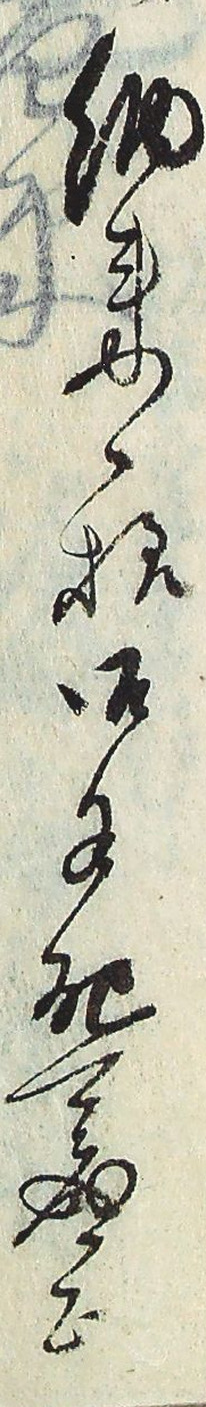納来候様御手配可被成候以上
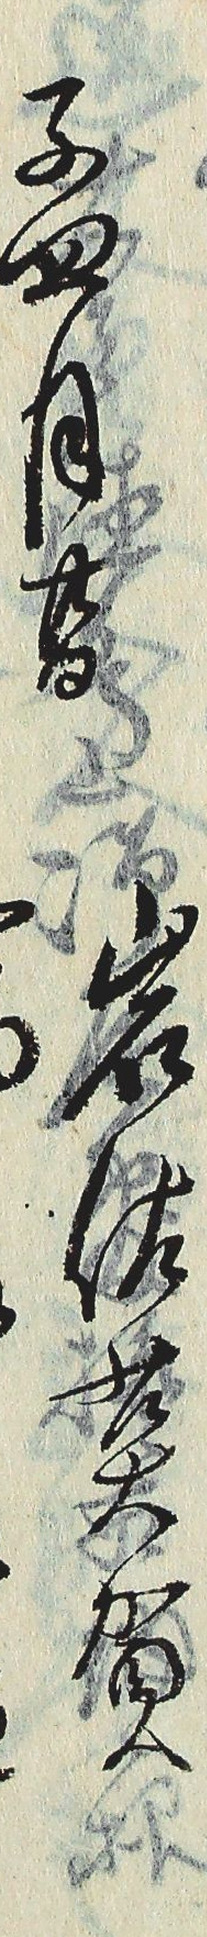子四月廿日岩佐英賀
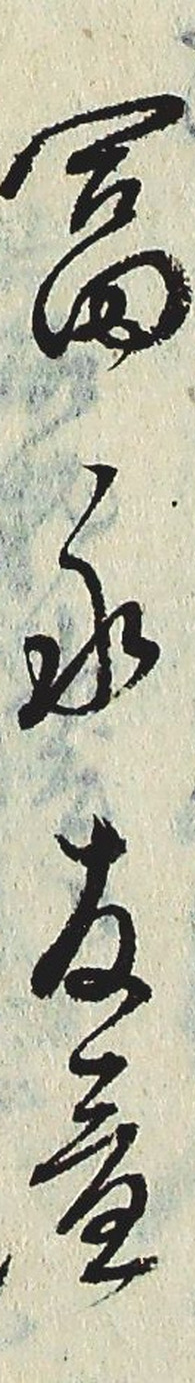富永友益
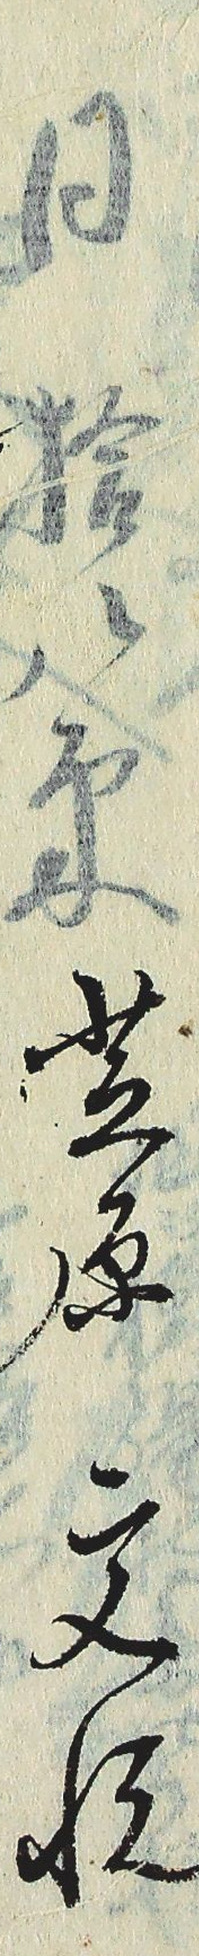芝原文悦
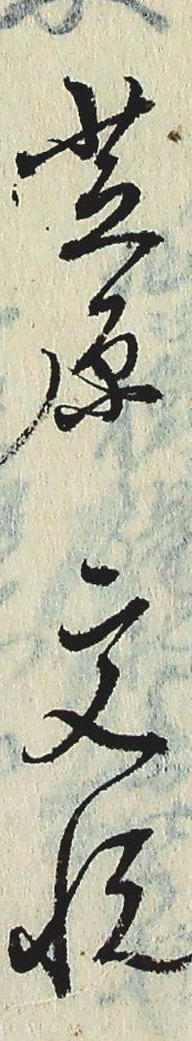芝原文悦
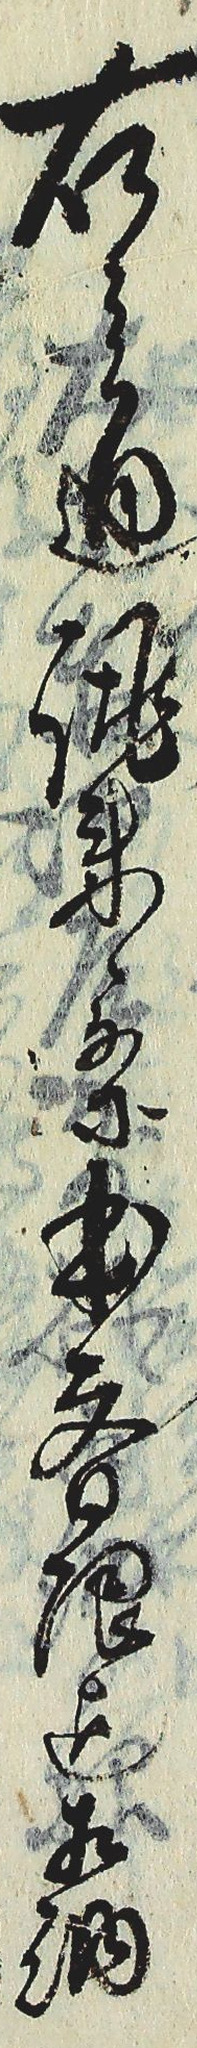右之通誂来候条本文日限迄相納
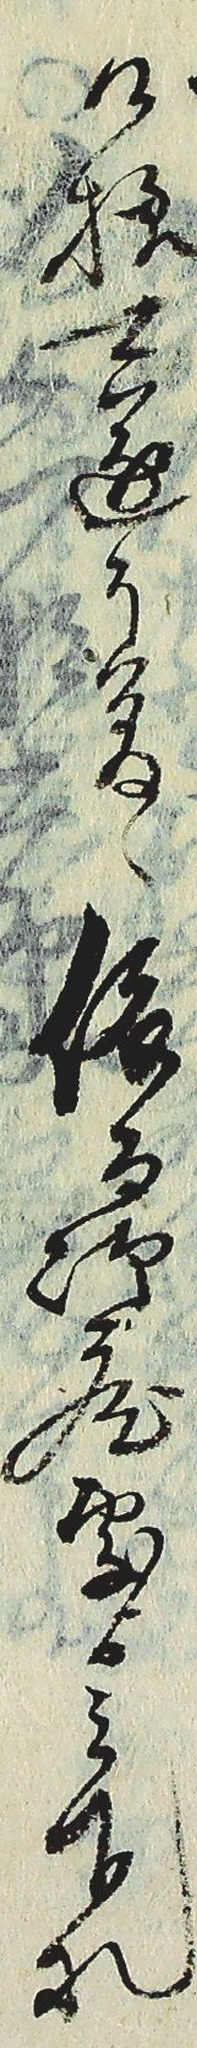候様可遂了簡候依て御蔵処ゟ之下札
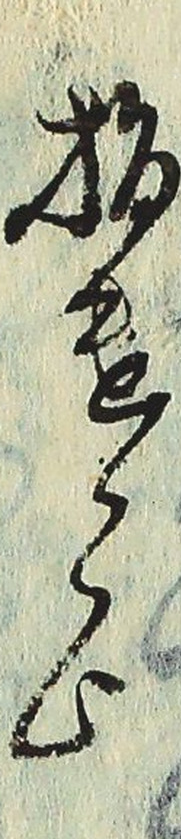指遣候以上
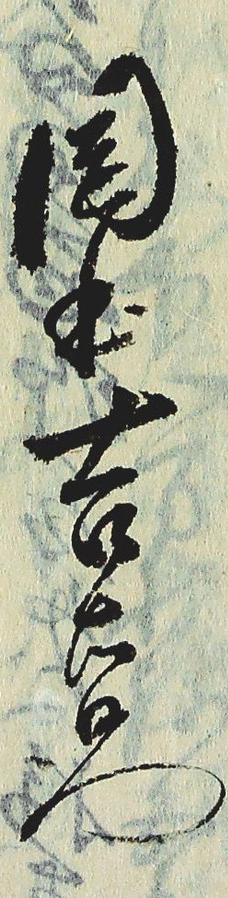岡本吉右衛門
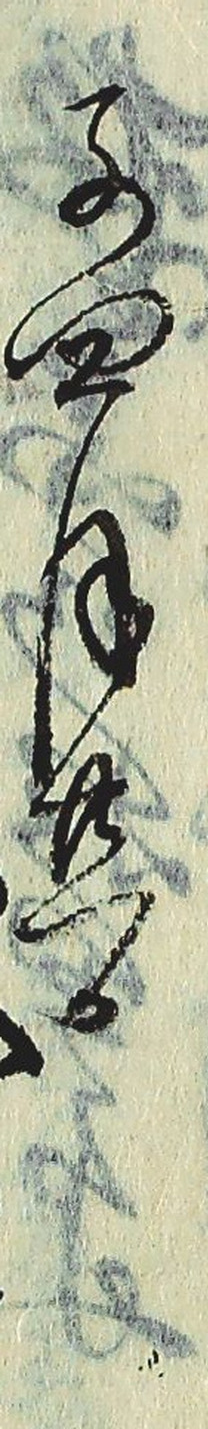子四月廿一日
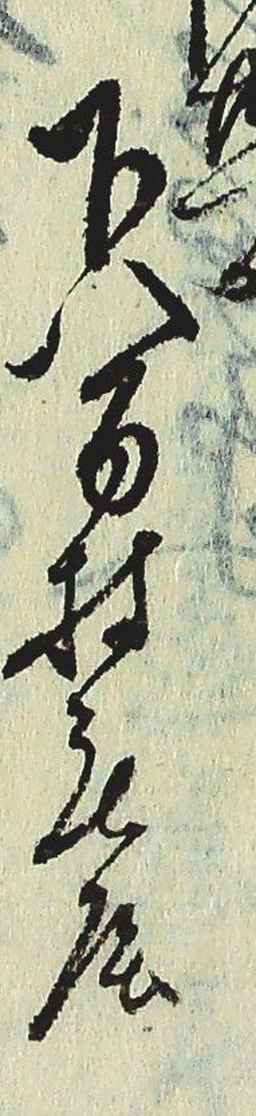下八万村庄屋
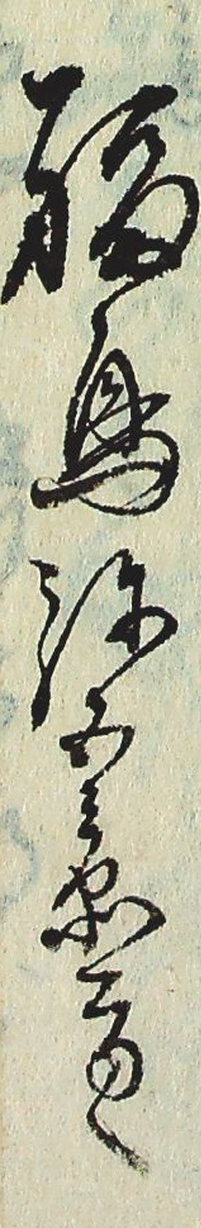福島弥五兵衛方へ
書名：名東郡中諸割賦元帳
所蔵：鳴門教育大学 Naruto University of Education
